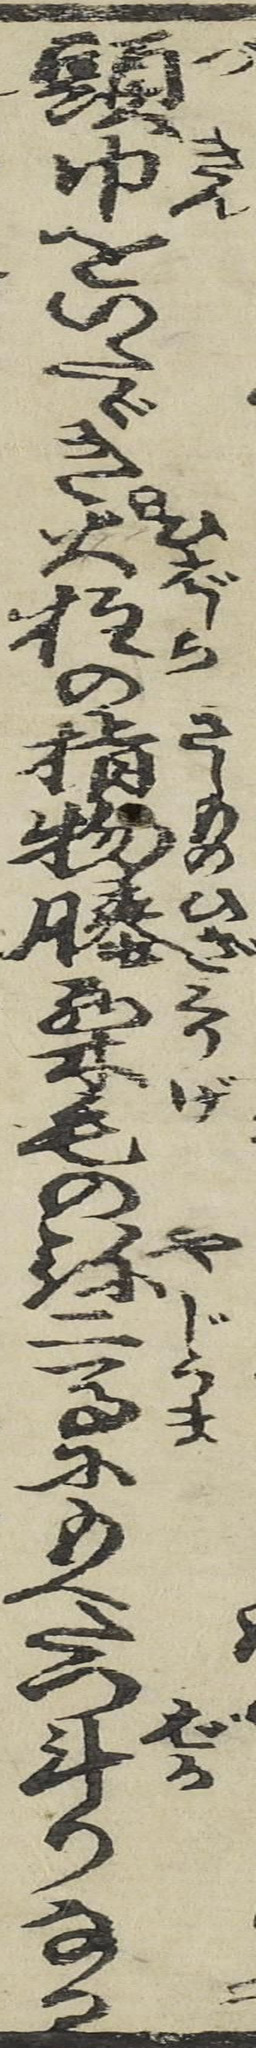頭巾をいたゞき火柱の指物膝栗毛の弥二馬にもへたつ斗りなる
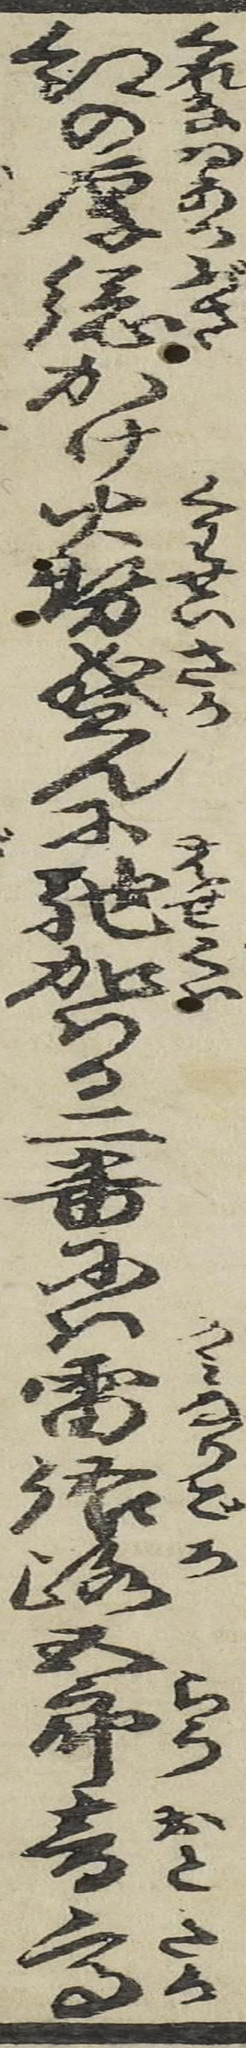紅の厚総かけ火勢盛んに馳加はる二番には雷語路五郎音高
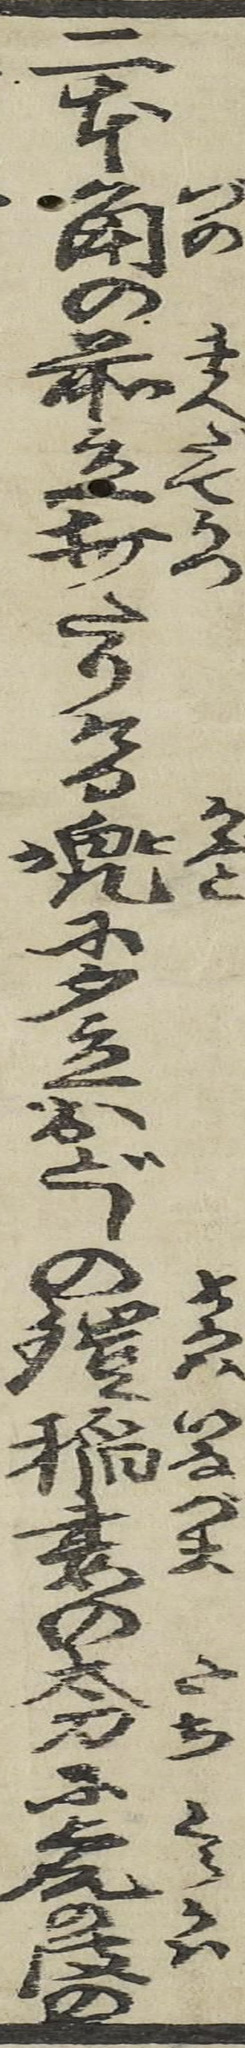二本角の前立打たりける兜に夕立おどしの鎧稲妻の太刀に虎の皮の
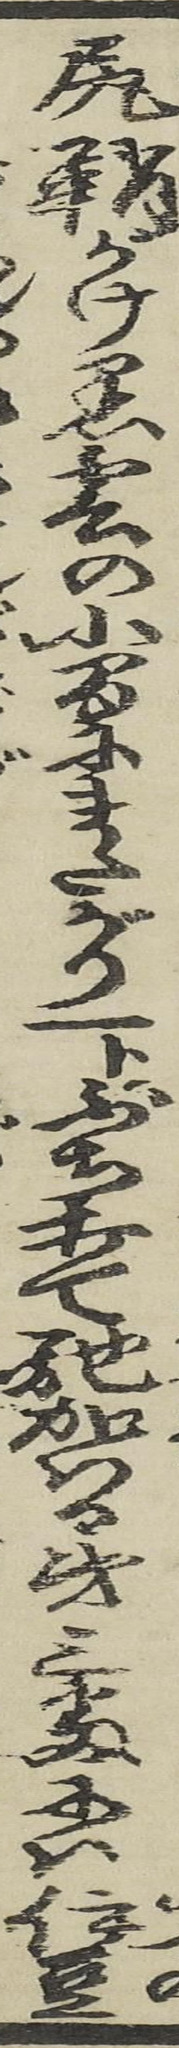尻鞘かけ黒雲の小間にまたがり一ぶち打て馳加はる第三番には伊豆
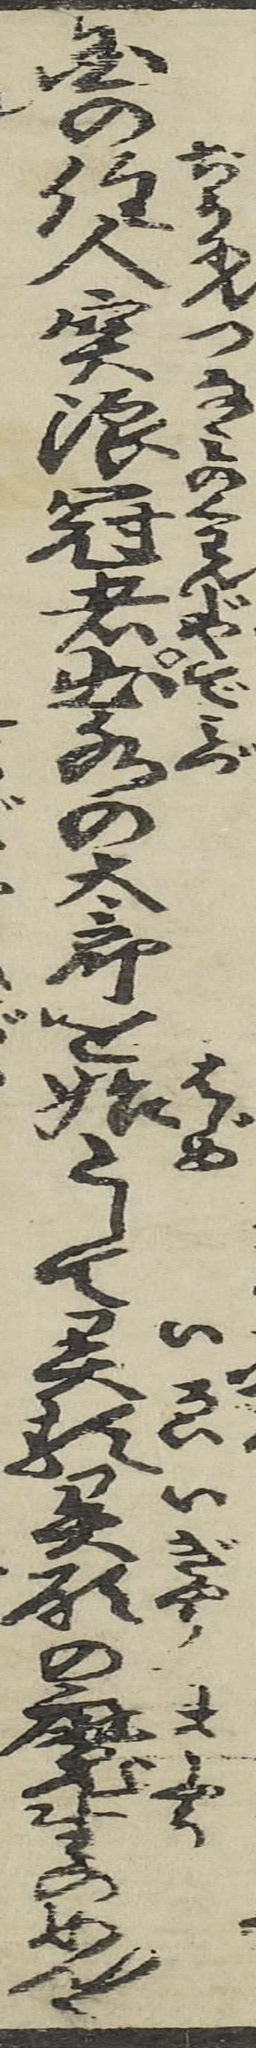国の住人突浪冠者出水の太郎を始として異類異形の魔生のめん〳〵
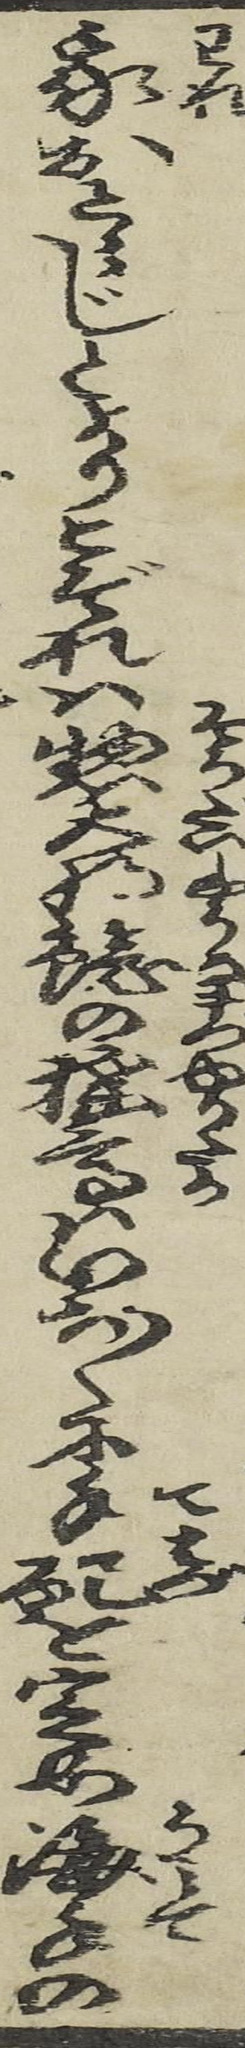我おとらじとよりこぞれは惣大将鯰の揺高はいろ〳〵に手配を定め海手の
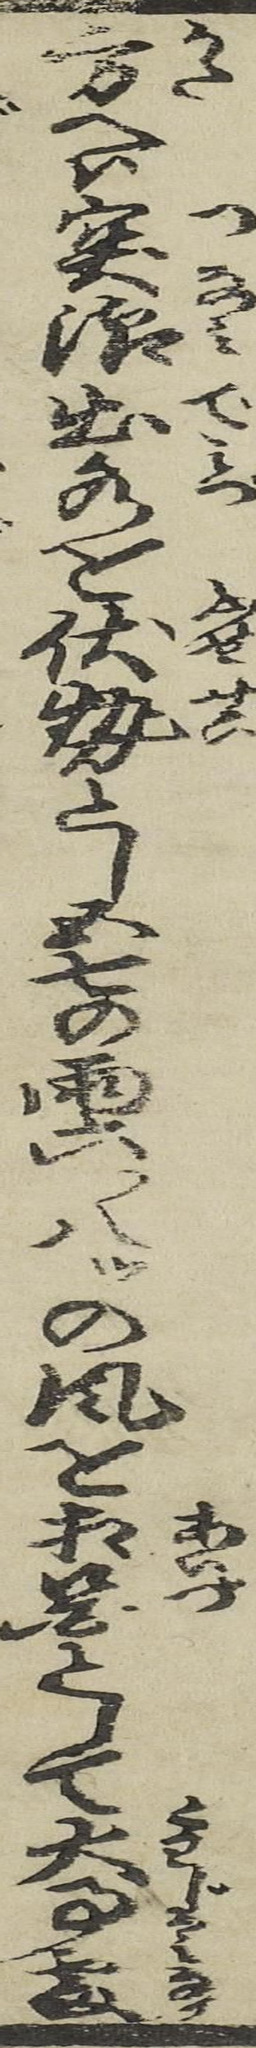方へは突浪出水を伏勢とし五七の両六ッ八ッの風を相図として大事処
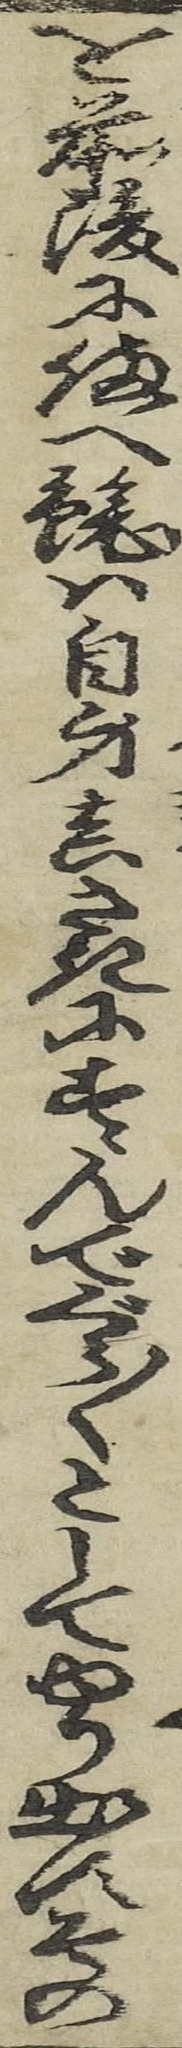を前後に備へ鯰は自身真さきにすゝんでぐら〳〵としてゆり出すその

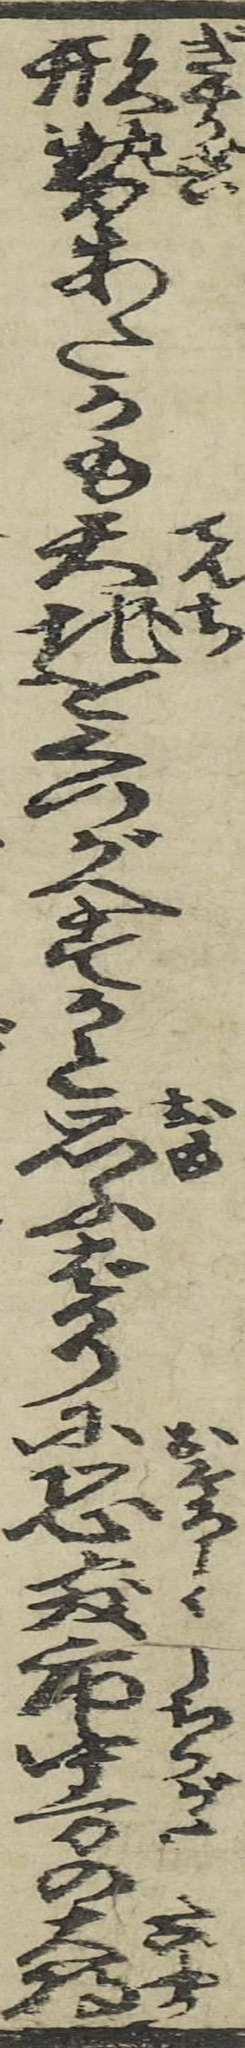形勢あたかも天地をくつがへすかと思ふばかりに恐敷市中方の大将
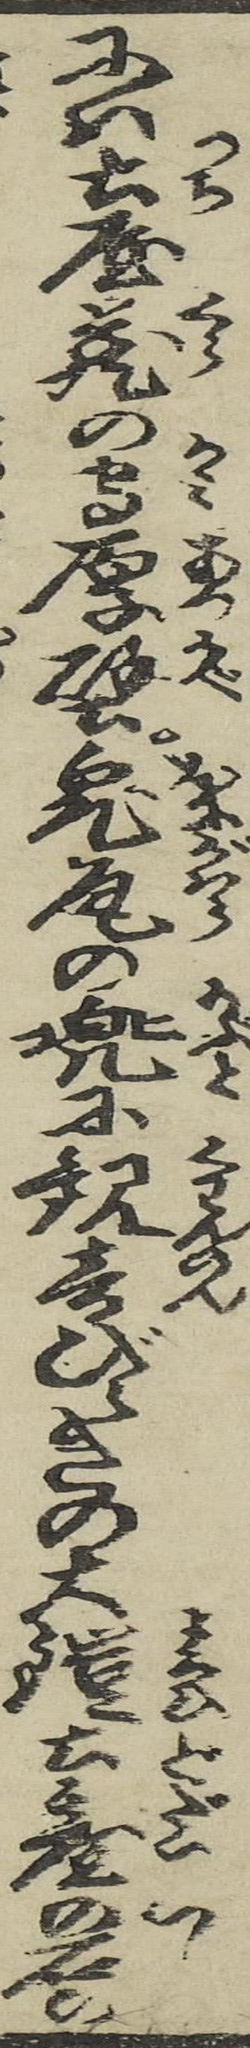には土屋蔵の守厚壁鬼瓦の兜に観音びらきの大鎧土台の石は
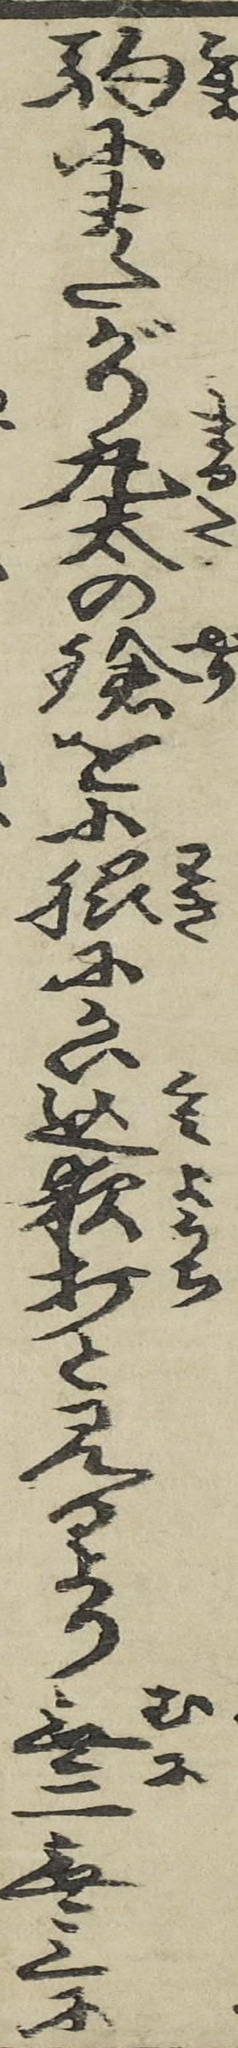駒にまたがり丸太の鎗を小脇にかい込夜打と見るより無二無三に
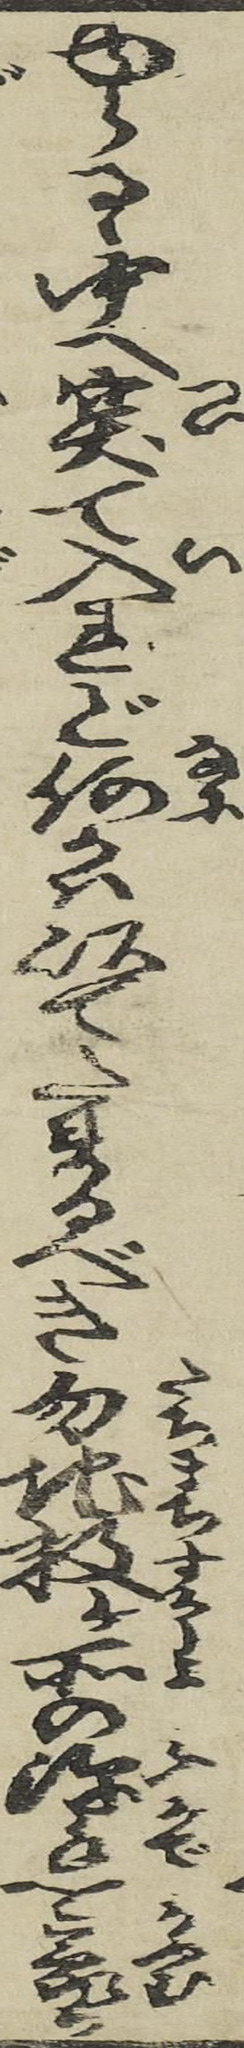ゆらるゝ中へ突て入れど何かは以てた見るべき忽地数ヶ所の深手を蒙り
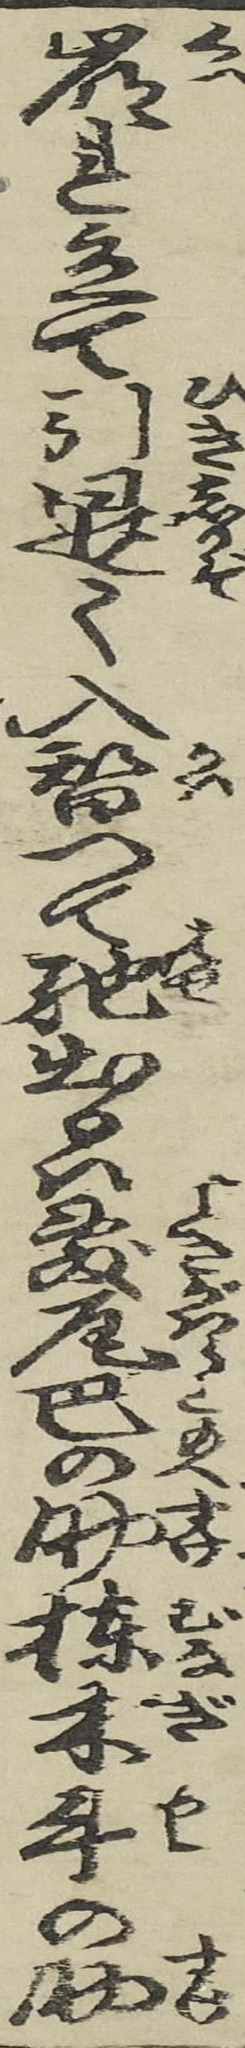崩れ立て引退て入替つて馳出るは敷瓦巴の助棟木牛の助
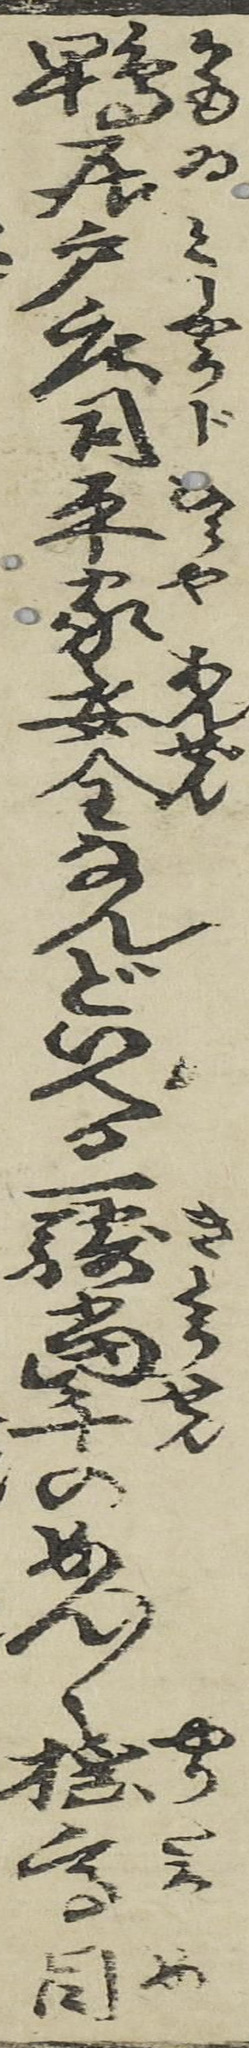鴨居戸庄司平家安全なんどいへる一騎当千のめん〳〵揺高目
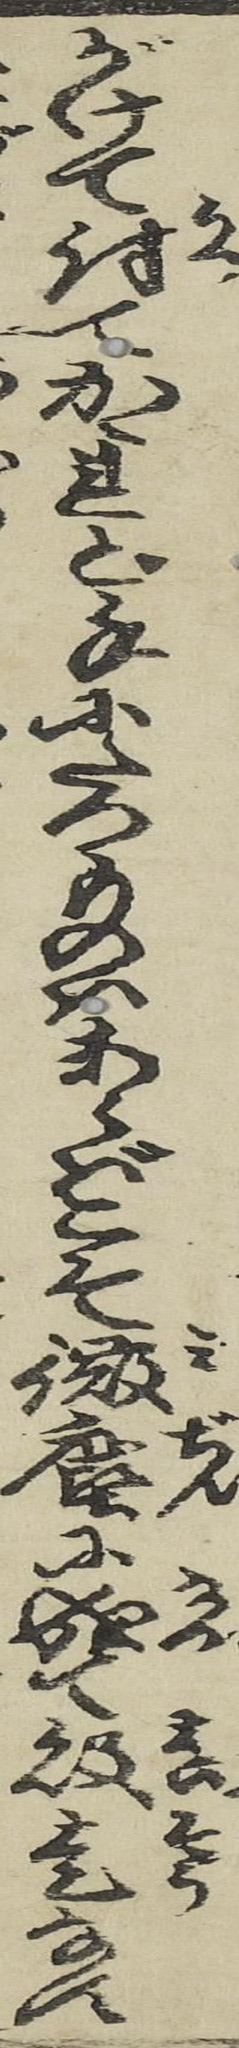がけて討てかゝれど手にたつものはあらばこそ微塵に成て敗走なす
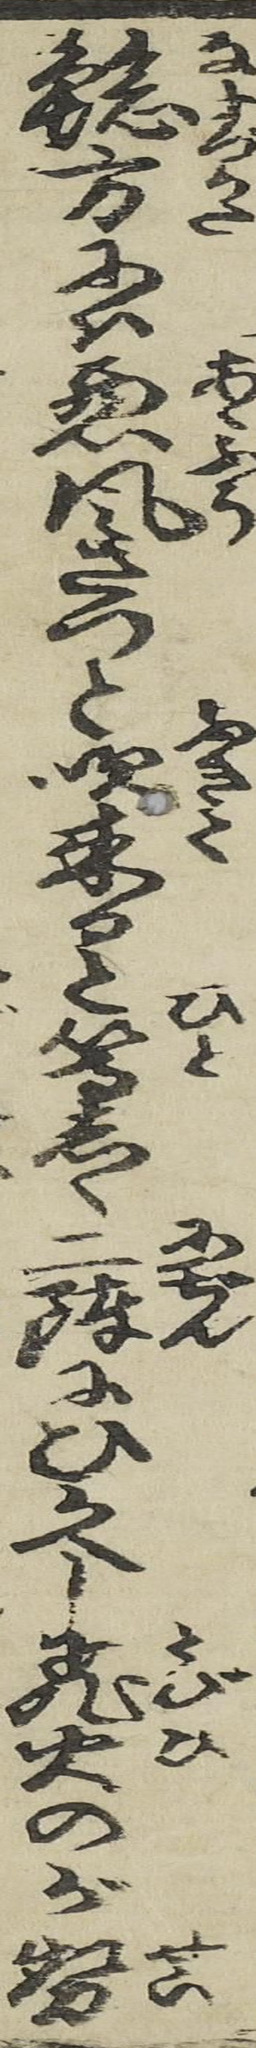鯰方には悪風さつと吹来ると等しく二陣にひかへし飛火のが勢
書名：安政大地震畧記　全
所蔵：東京大学地震研究所図書室 Earthquake Research Institute Library, The University of Tokyo, JAPAN
